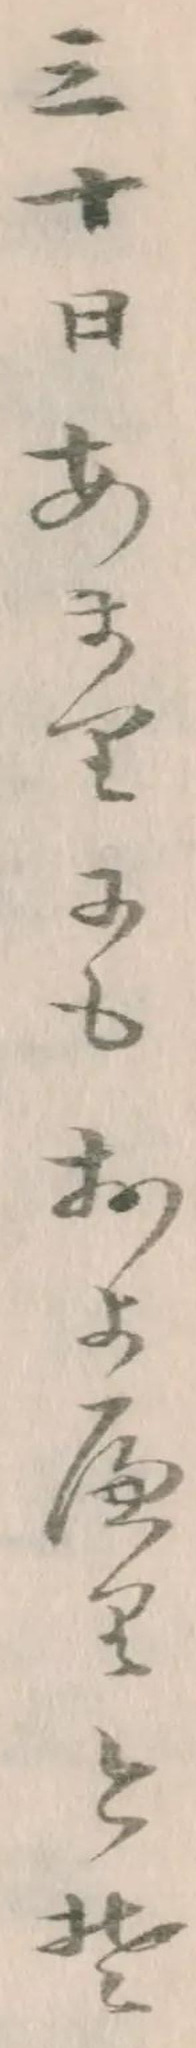三十日あまりにもおよへりとそ
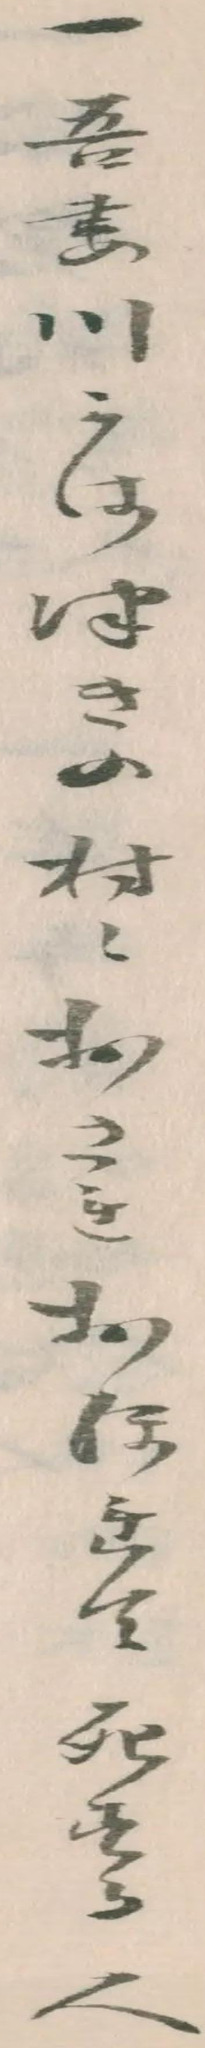一吾妻川かわつきの村々おされおほれて死する人
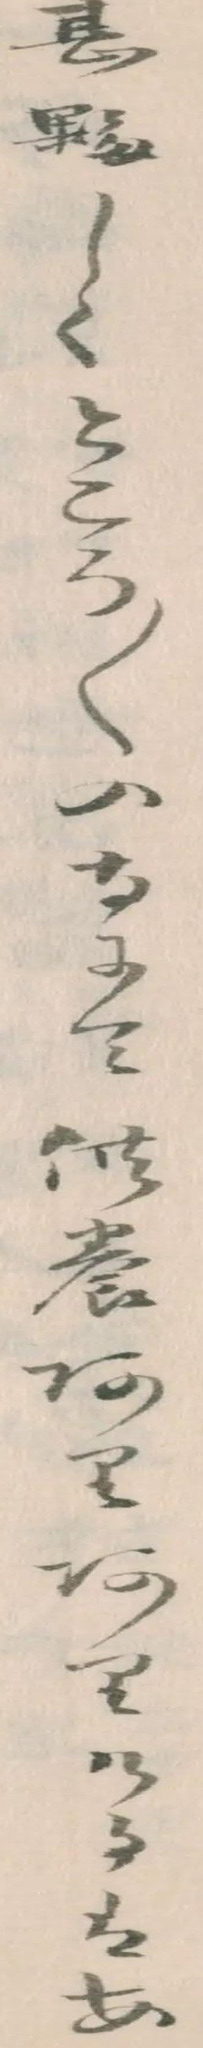甚夥しくところ〳〵の寺にて供養ありありけるはあ
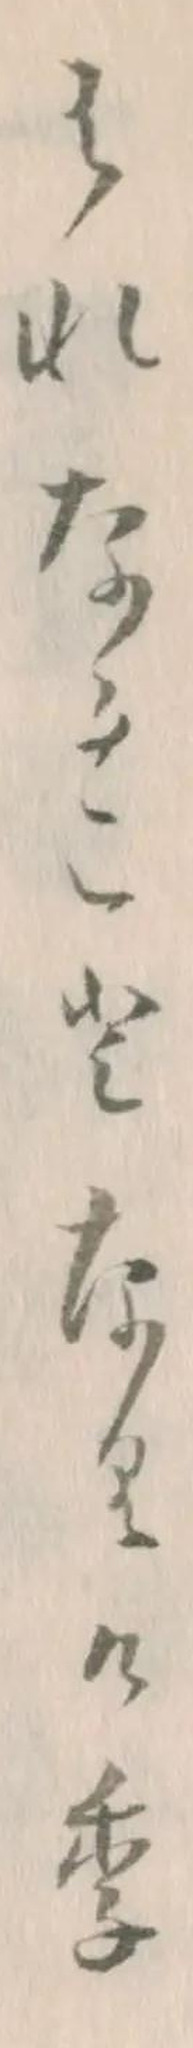はれなることなりけり
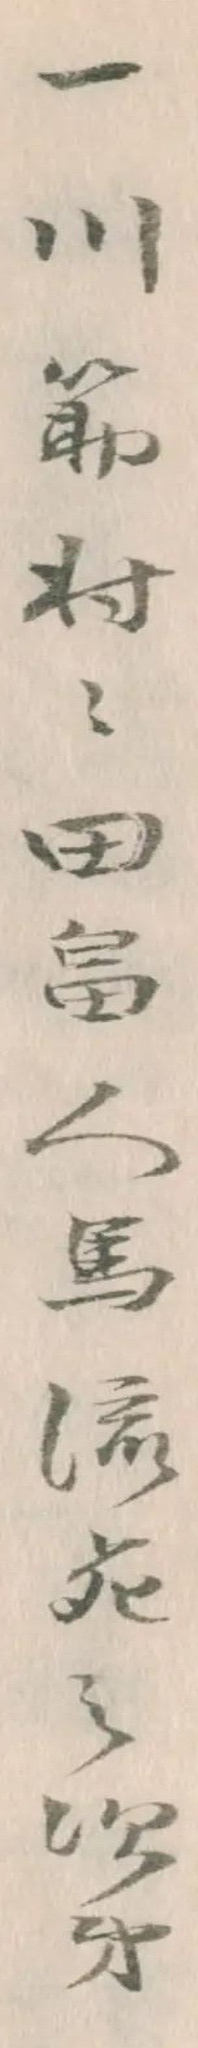一川筋村々田畠人馬流死之次第

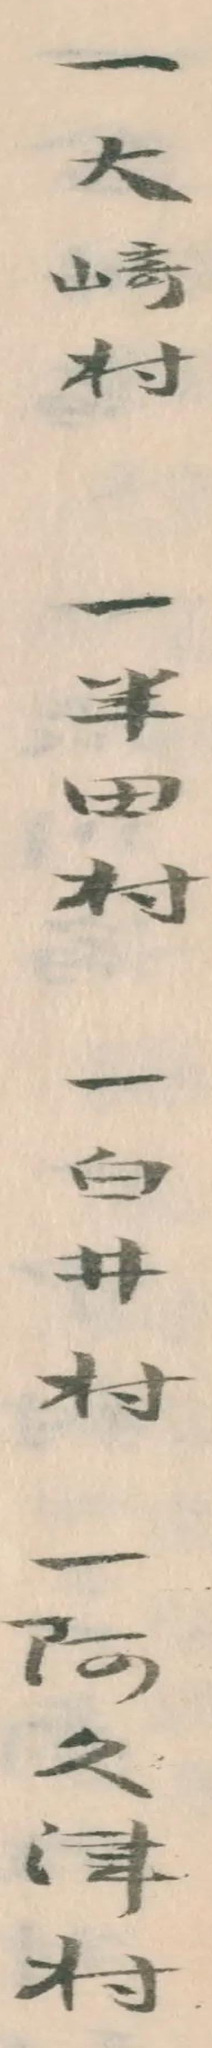一大崎村一半田村一白井村一阿久津村
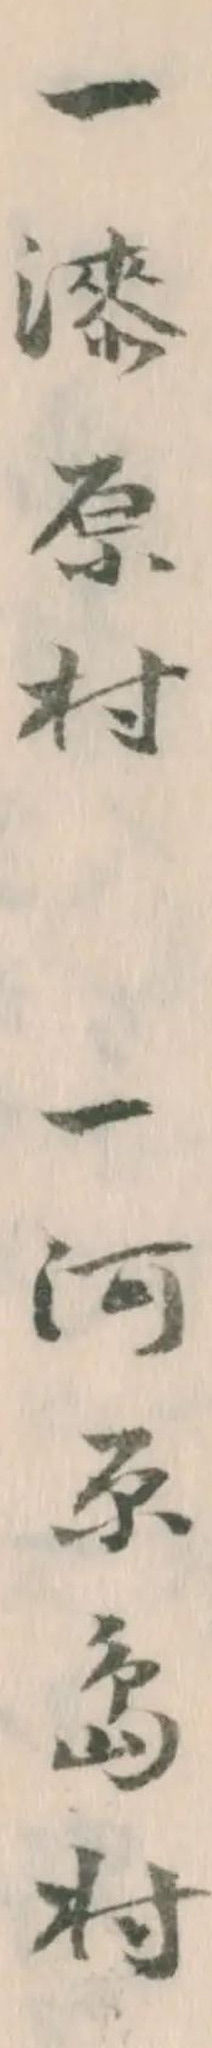一漆原村一河原島村
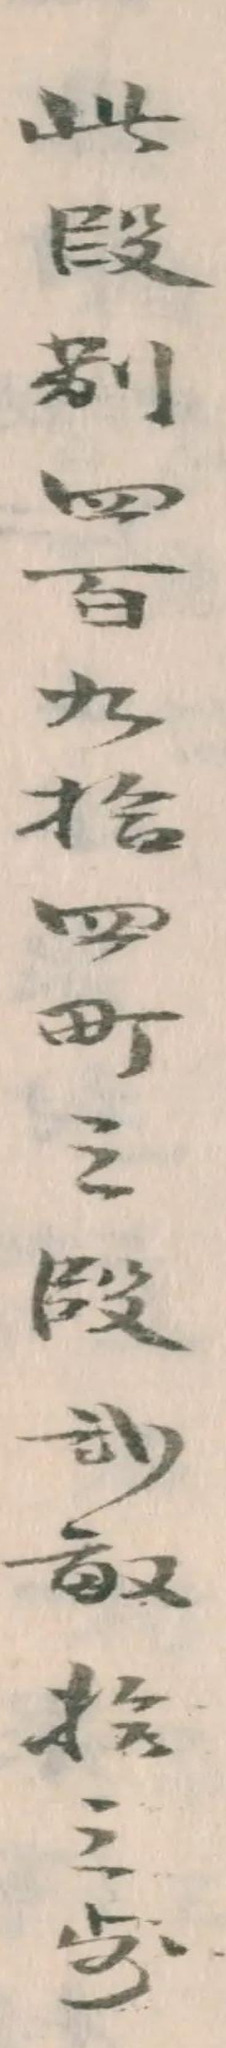此段別四百九拾四町三段弐畝拾三歩
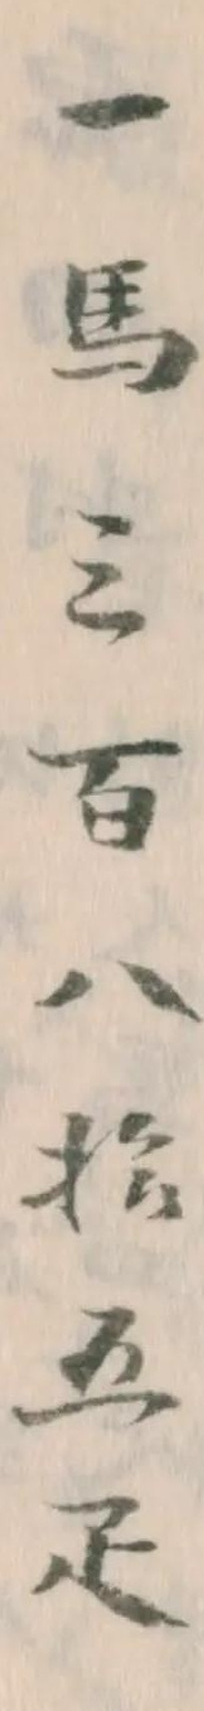一馬三百八拾五疋
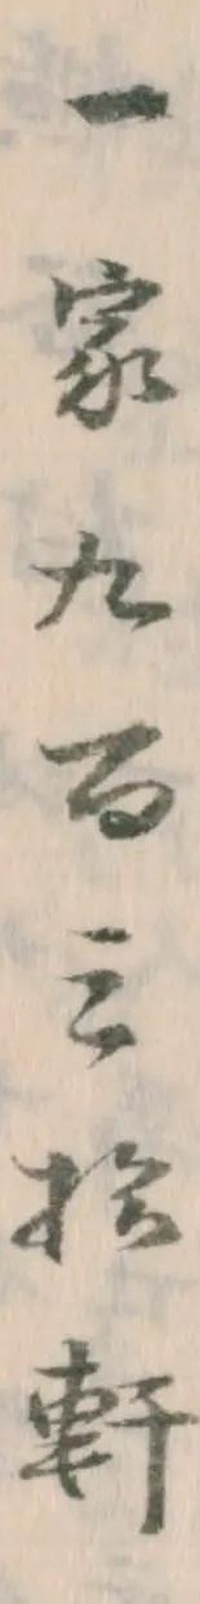一家九百三拾軒
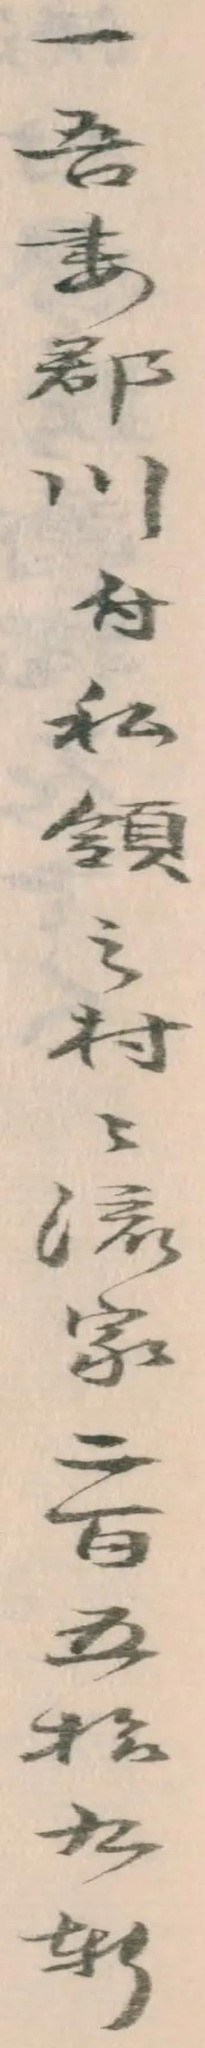一吾妻郡川付私領之村々流家二百五拾九軒
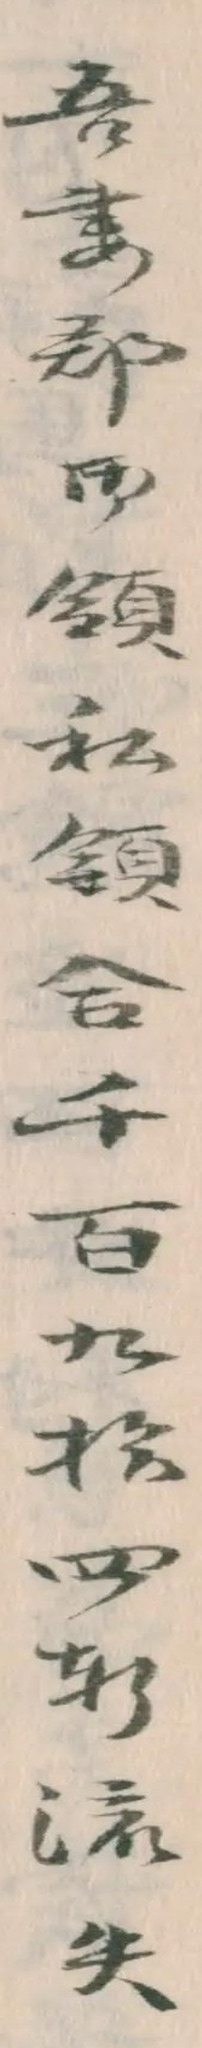吾妻郡御領私領合千百九拾四軒流失
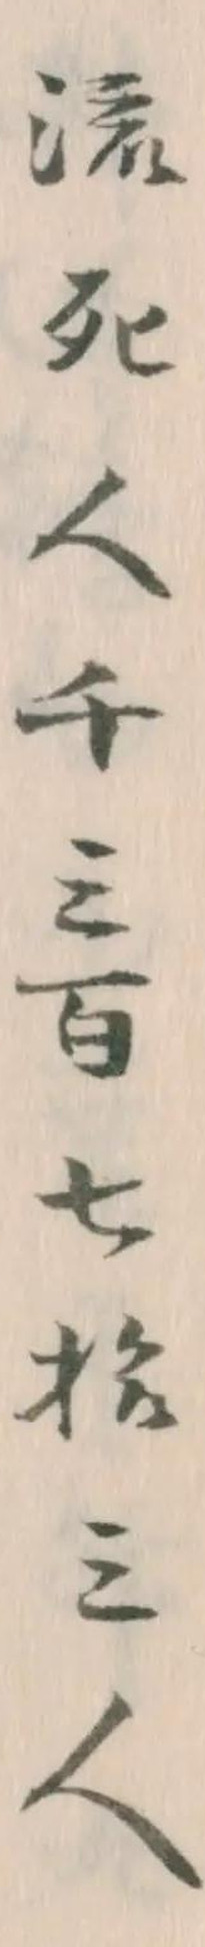同流死人千三百七拾三人
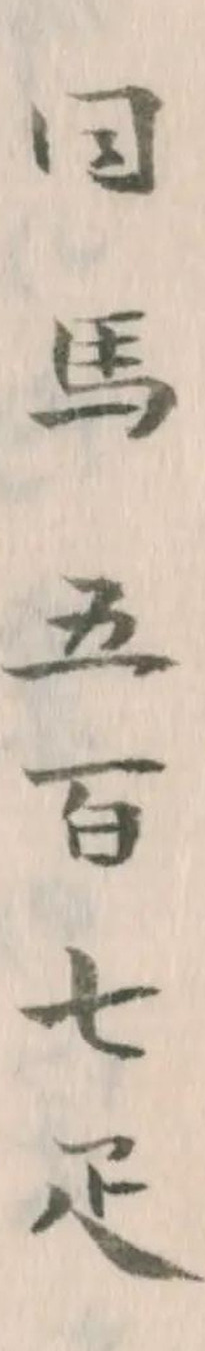同同馬五百七疋
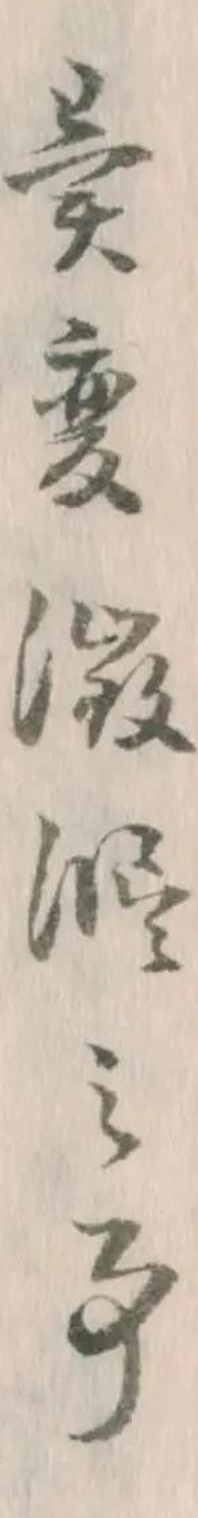異変微段之事
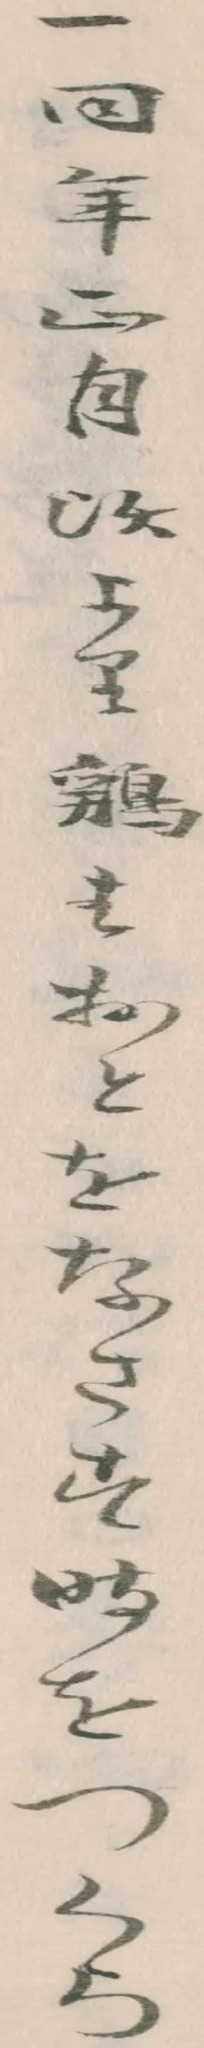一同年正月頃より鶏はおとをなさす時をつくら
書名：地災撮要. 巻11-12(地震之部)
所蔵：国立国会図書館 National Diet Library, JAPAN
